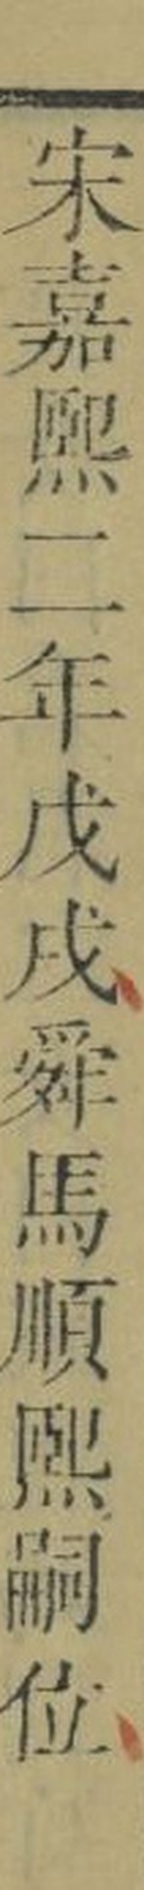宋嘉熙二年戊戌舜馬順熙嗣位
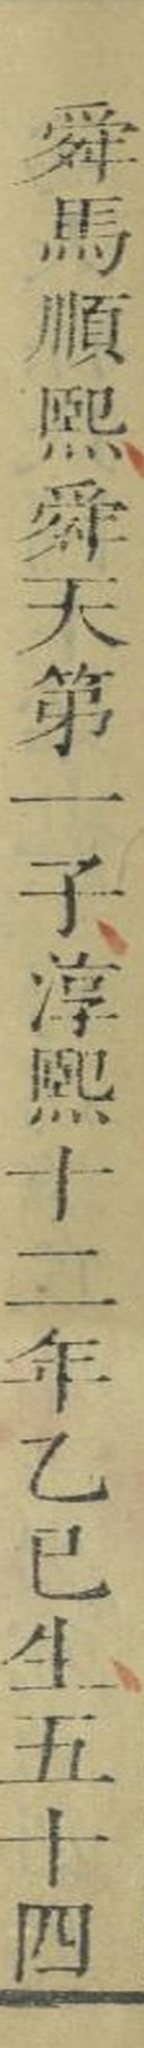舜馬順熙舜天第一子淳熙十二年乙巳生五十四
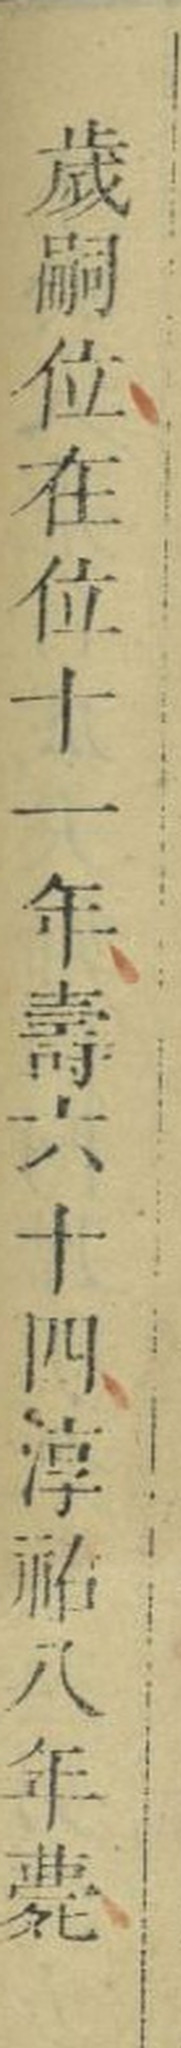歳嗣位在位十一年寿六十四淳祐八年薨
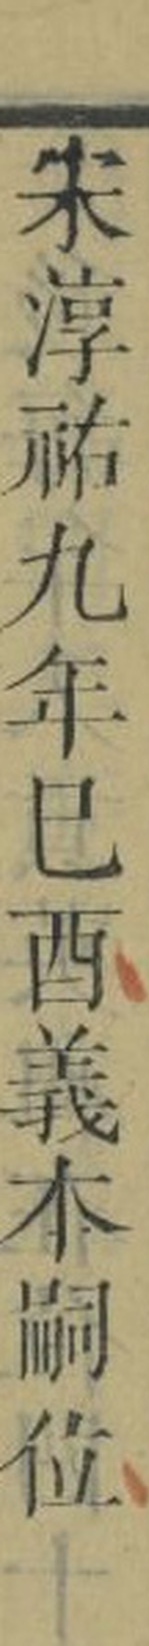宋淳祐九年巳酉義本嗣位
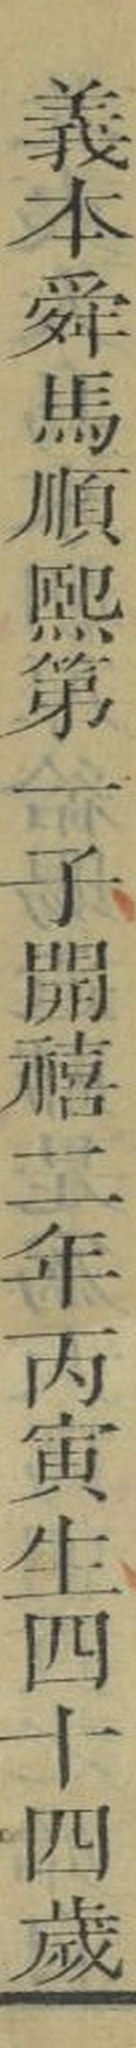義本舜馬順熙第一子開禧二年丙寅生四十四歳
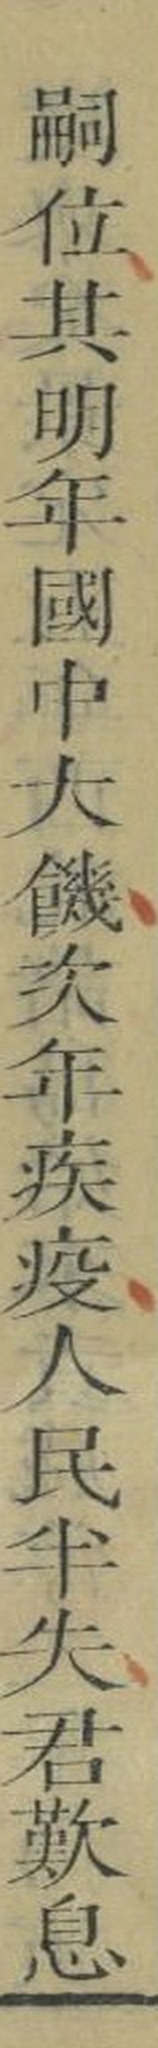嗣位其明年国中大饑次年疾疫人民半失君歎息
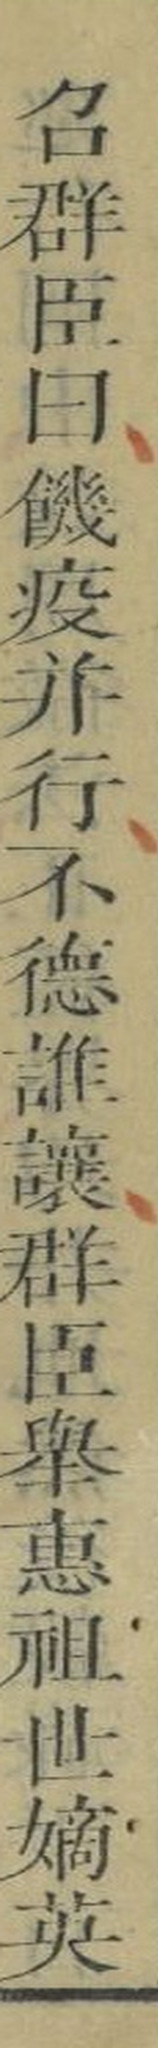召群臣曰饑疫并行不徳誰譲群臣挙恵祖世嫡英
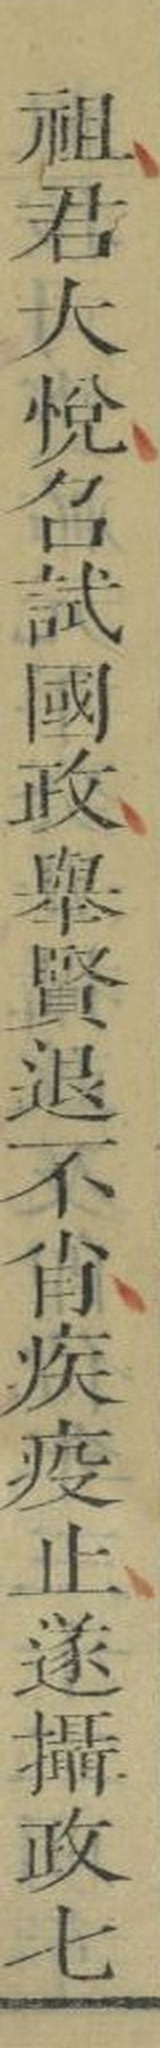祖君大悦召試国政挙賢退不肖疾疫止遂摂政七
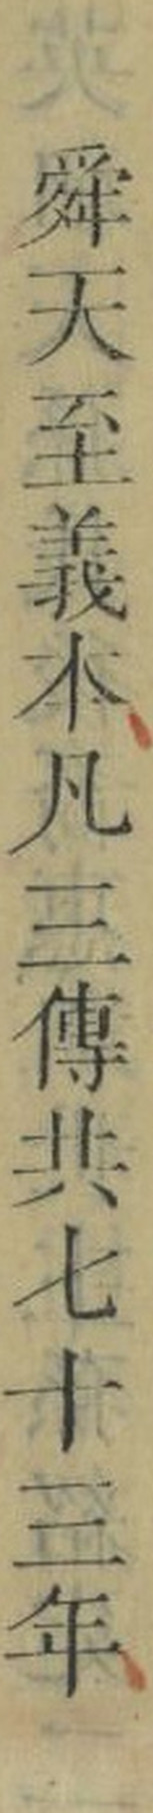舜天至義本凡三伝共七十三年

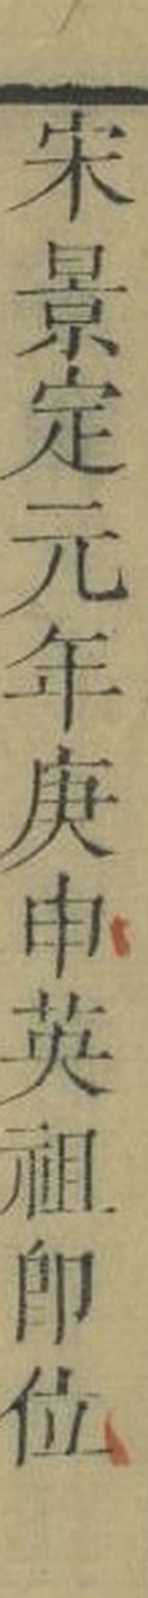宋景定元年庚申英祖即位
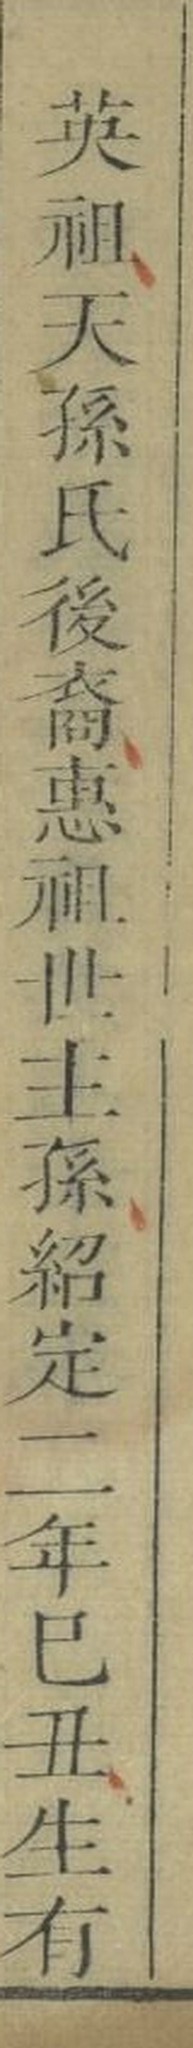英祖天孫氏後裔恵祖世主孫紹定二年巳丑生有
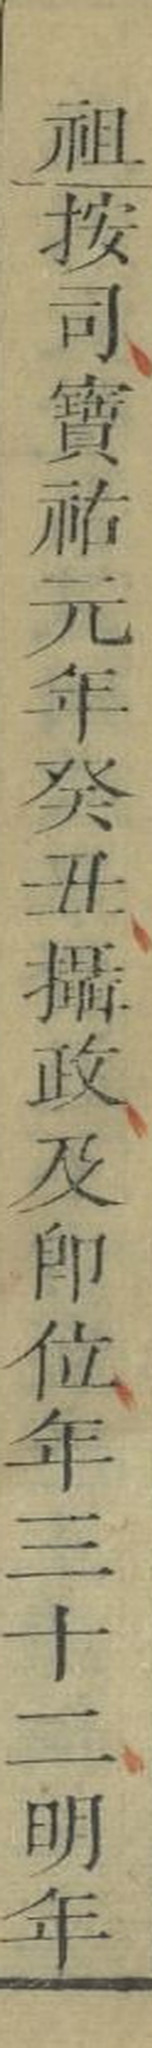祖]按司宝祐元年癸丑摂政及即位年三十二明年
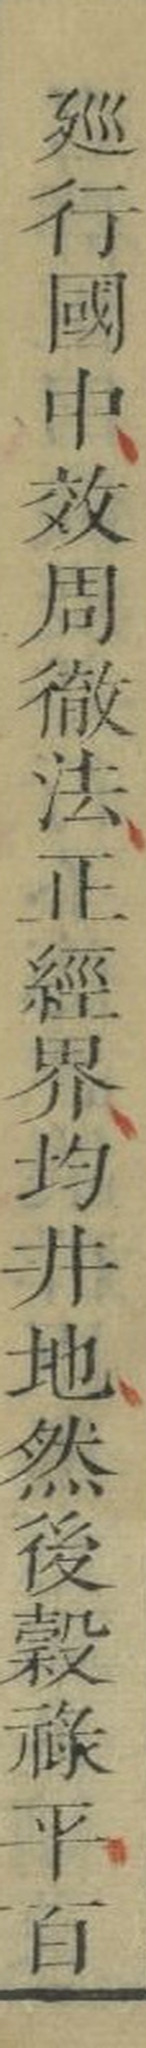巡行国中效周徹法正経界均井地然後穀禄平百
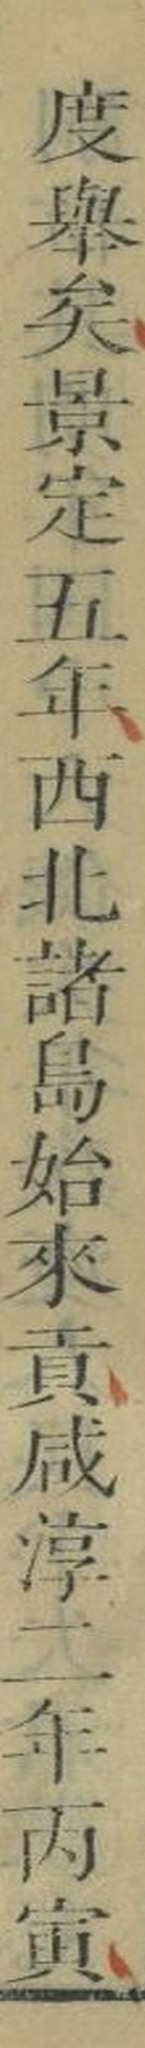度挙矣景定五年西北諸島始来貢咸淳二年丙寅
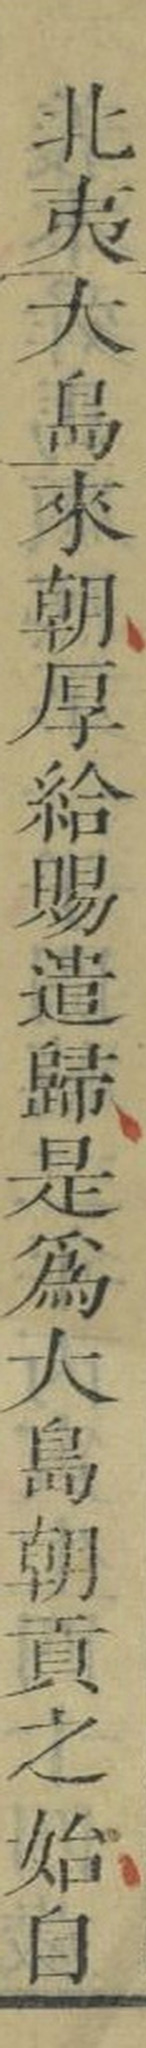北夷[大島]来朝厚給賜遣帰是為大島朝貢之始自
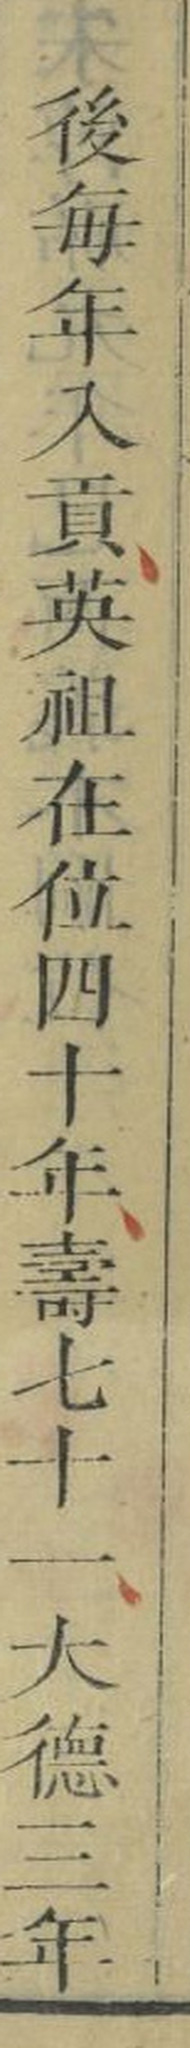後毎年入貢英祖在位四十年寿七十一大徳三年
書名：中山伝信録 巻三
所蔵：University of the Ryukyus Library
